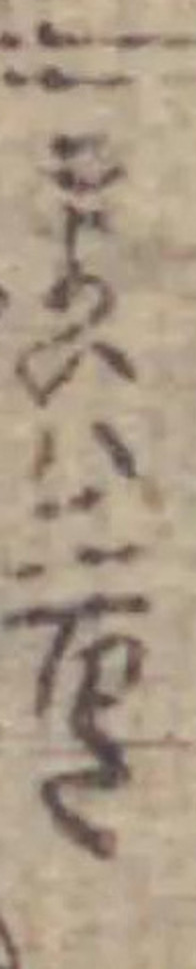こよいは二百た
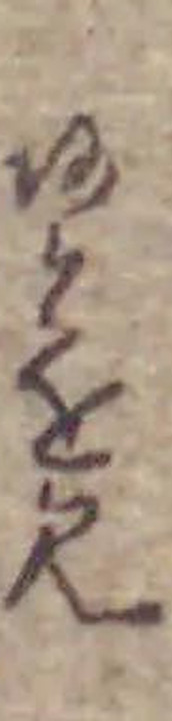あとを見

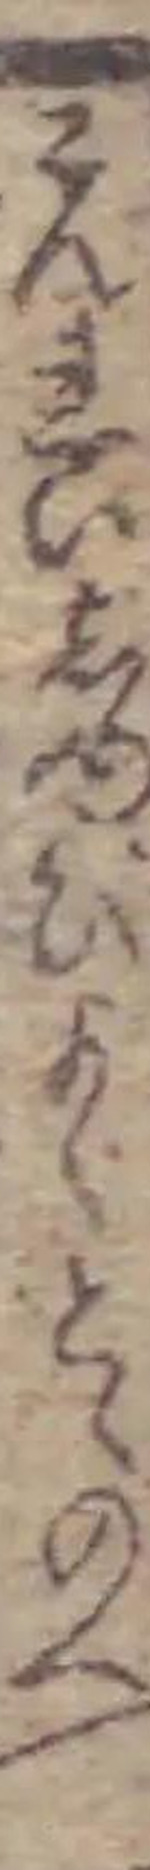こんれいしゆびよくとゝのへ
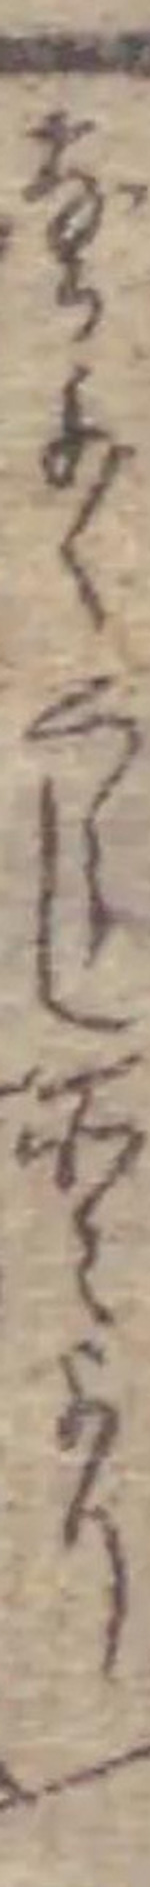なかよくくらし所々より
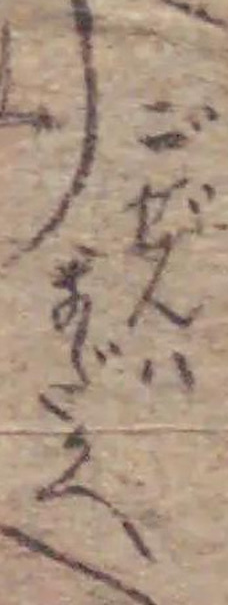まだかへ
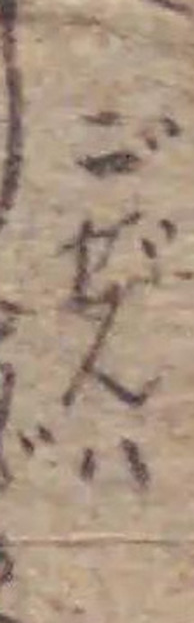ごぜんは
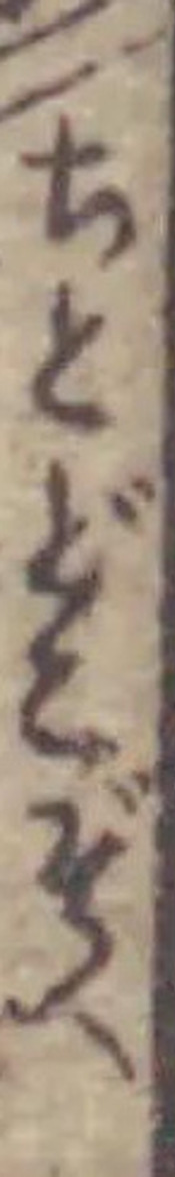ちとどこぞへ
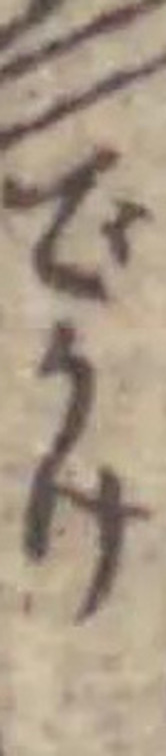でかけ
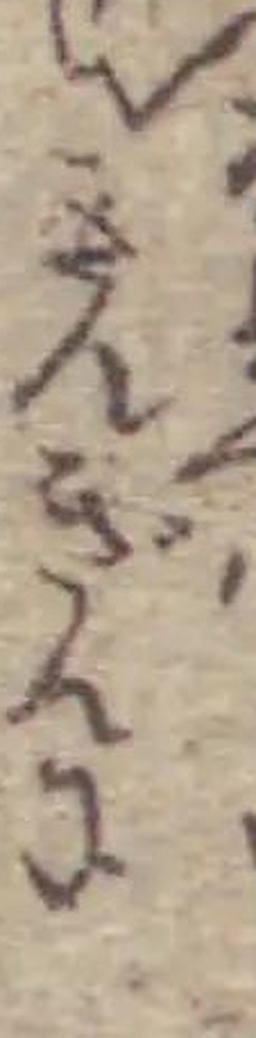きんぎんに
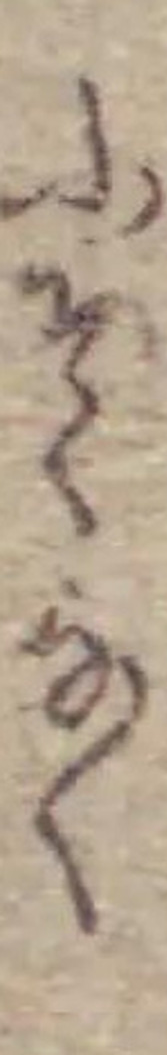ふそくなく
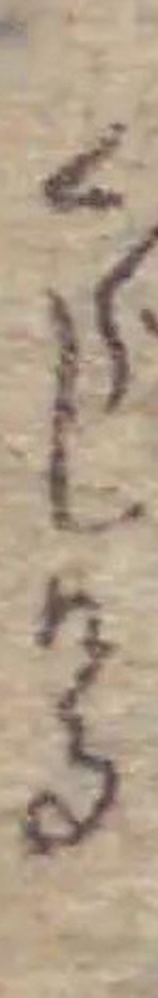くらしける
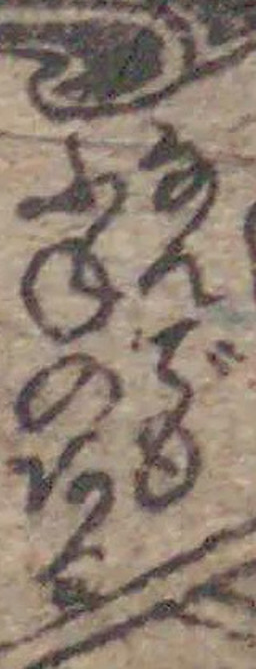ふねのある

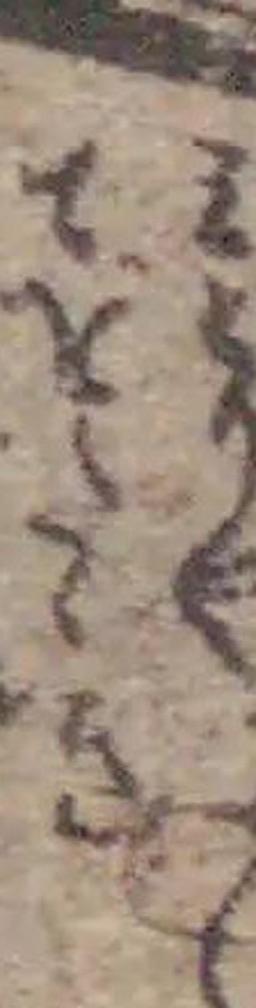てをたゝき
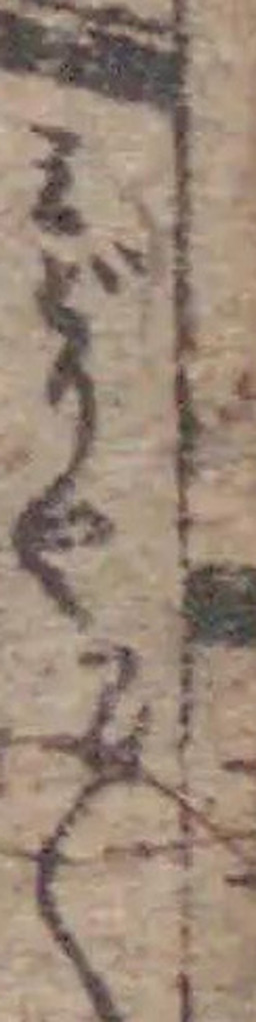みどりやァ〳〵
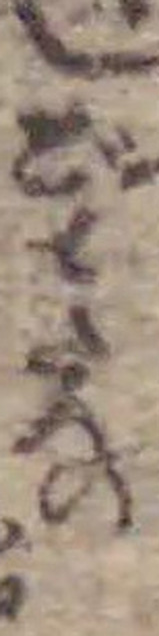ごてさんの
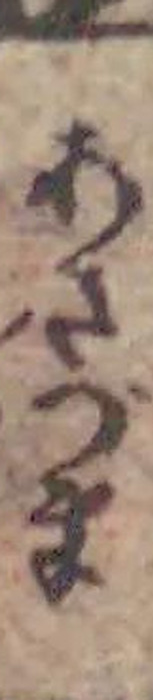あさづま
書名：日待御利生此ごろ噂 3巻
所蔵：国立国会図書館 National Diet Library, JAPAN
